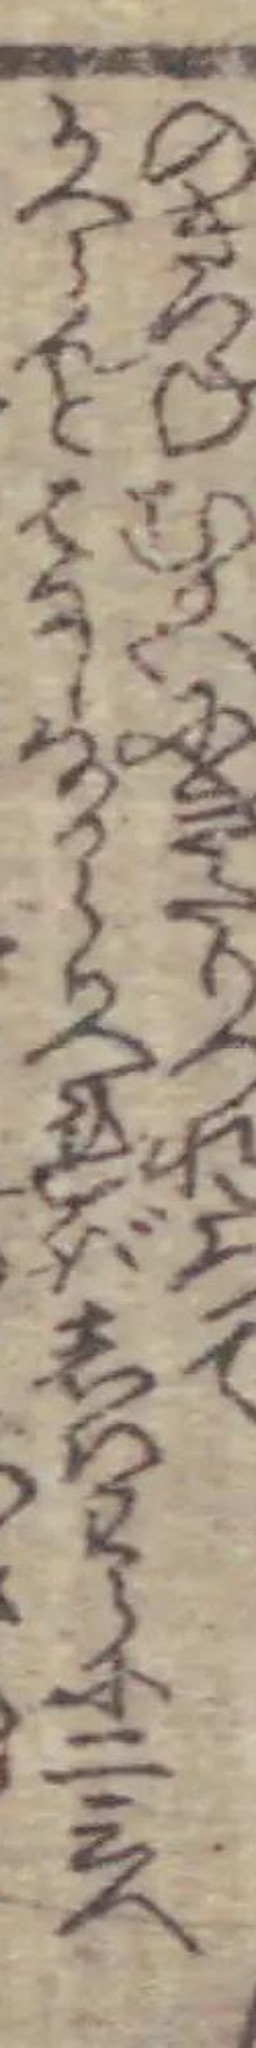かへらんとはなしなからかへればしはわらに二三人
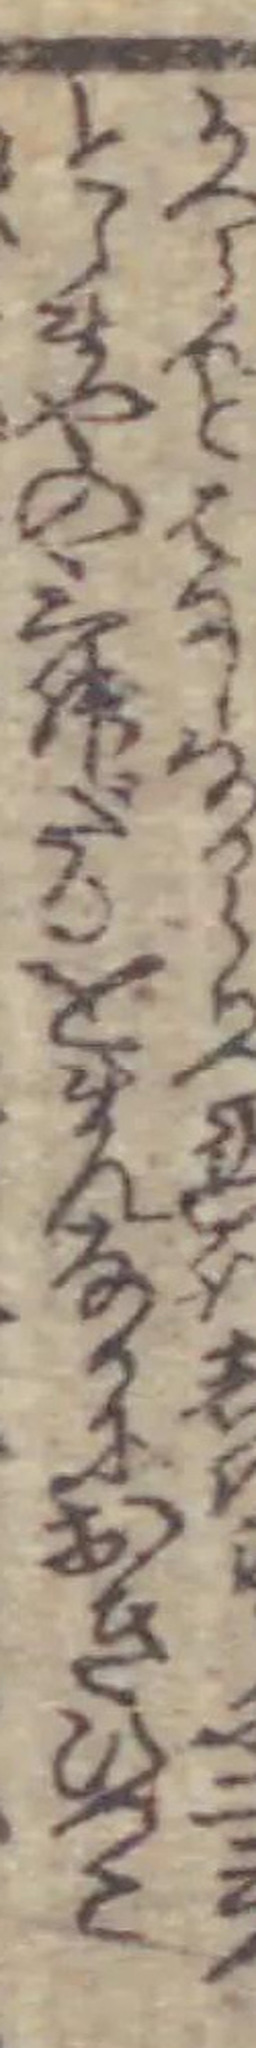としまやの三升だるをまんなかにおきひつこ
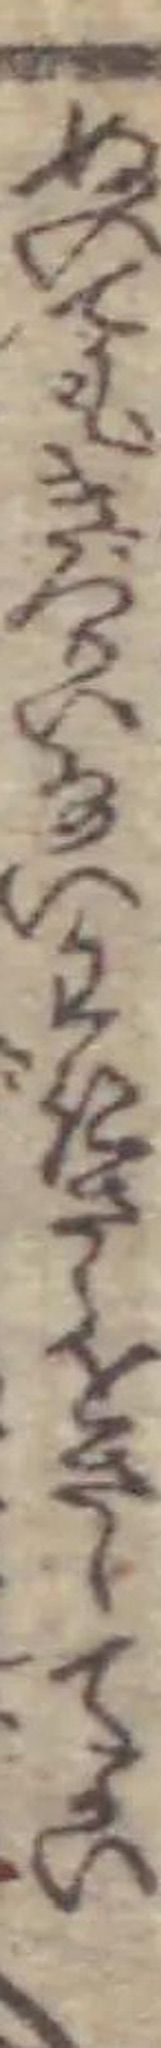ぬいてもきづかいないわきさしをさしてよい
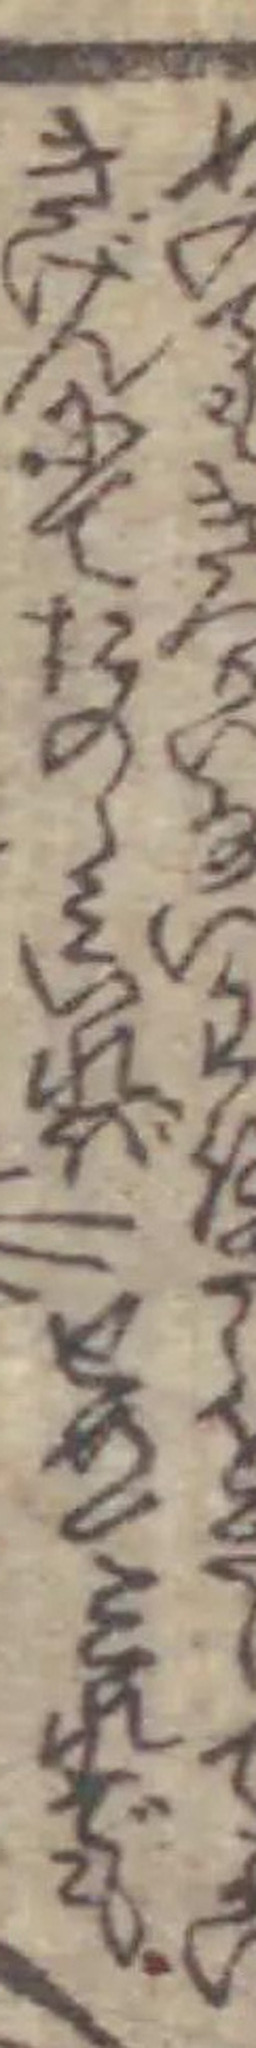きげんにてたのしみいればせめてこれでも
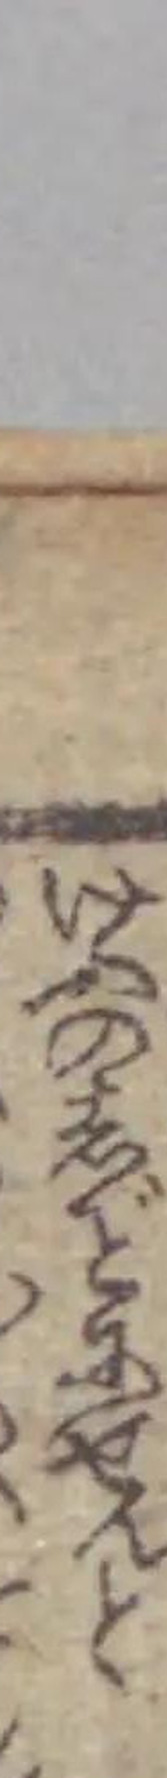けふのしごとにせんと
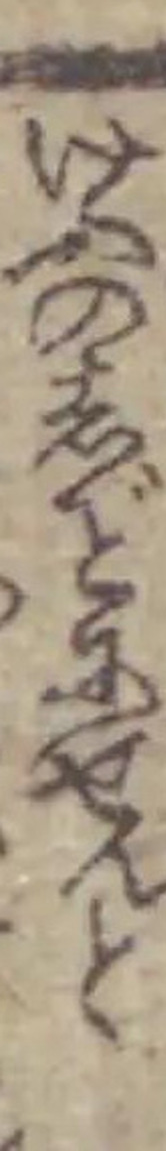けふのしごとにせんと
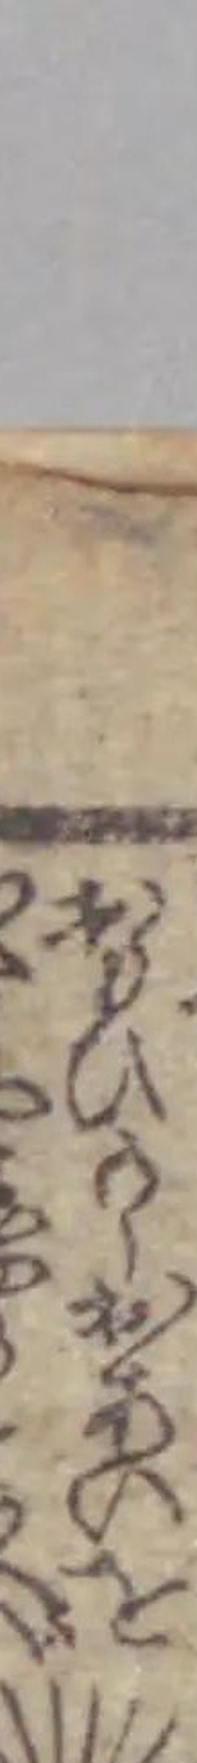おもひもしおあいを
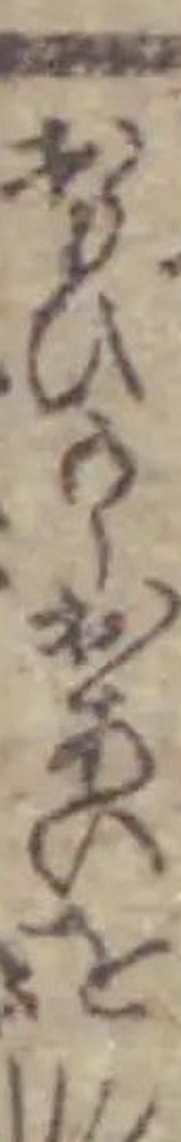おもひもしおあいを
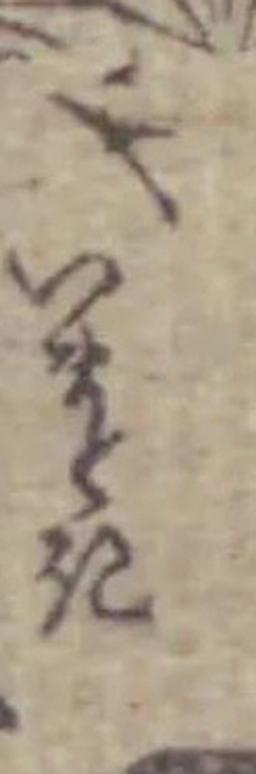いまとき
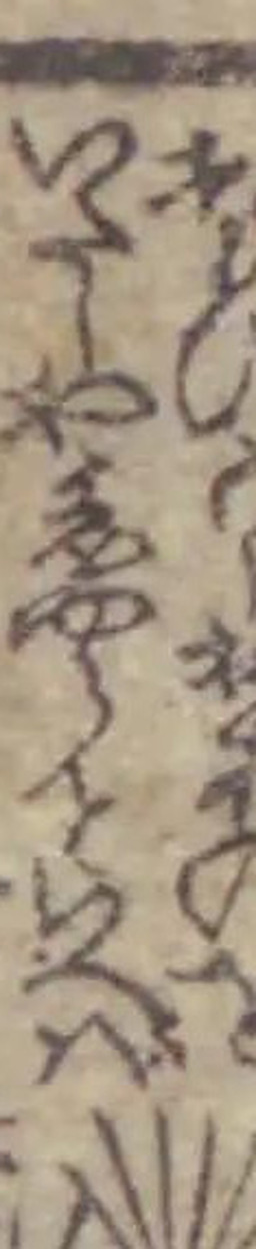いたしやしやうといへば
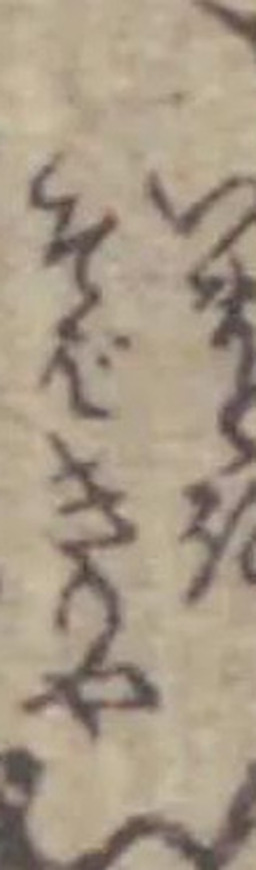そばきりや
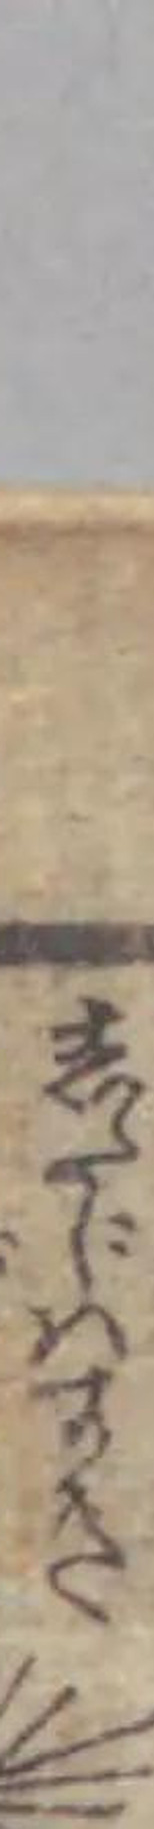したじはすき
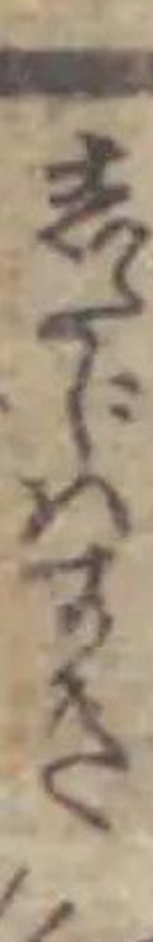したじはすき
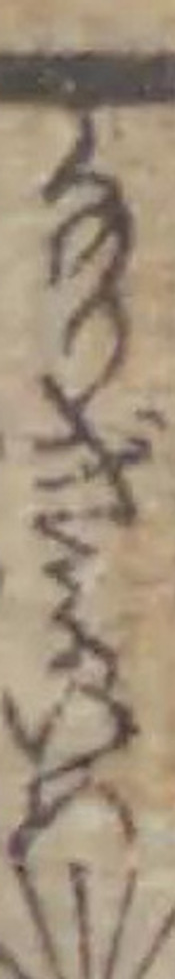なりぎよいは
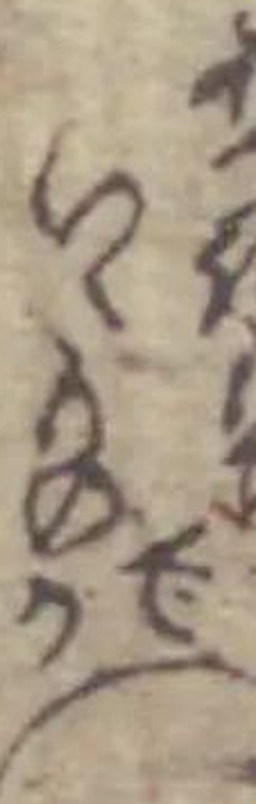いゝものか
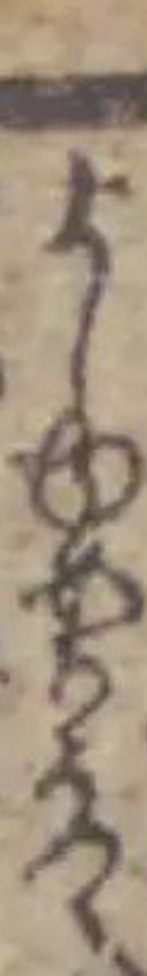よしゆめかうつゝ
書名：化物昼寝鼾 2巻
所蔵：国立国会図書館 National Diet Library, JAPAN
